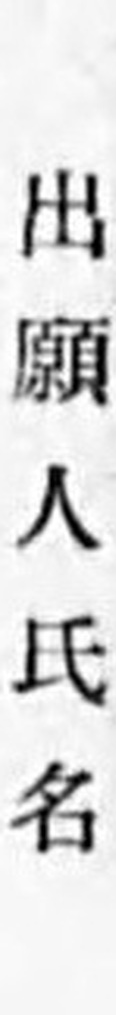出願人氏名
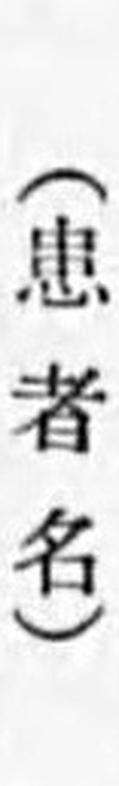(患者名)
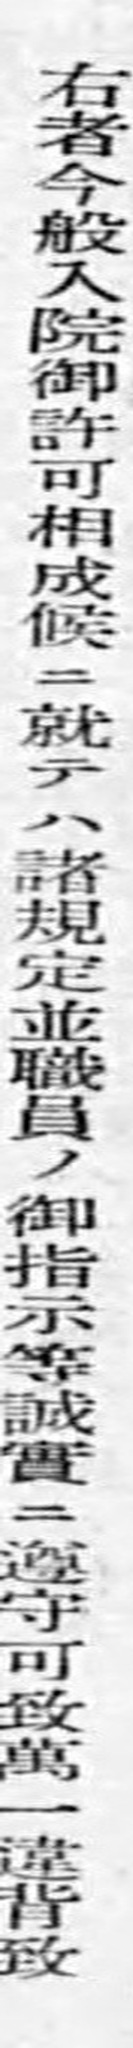右者今般入院御許可相成候ニ就テハ諸規定並職員ノ御指示等誠実ニ遵守可致万一違背致
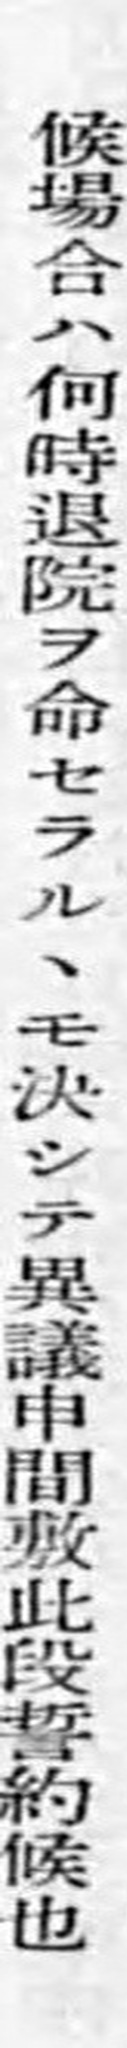候場合ハ何時退院ヲ命セラルヽモ決シテ異議申間敷此段誓約候也
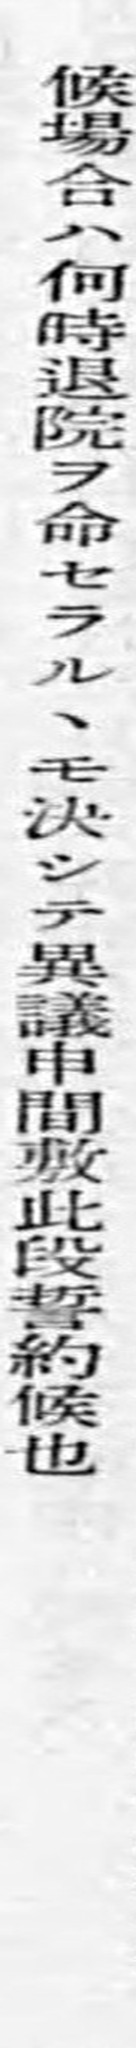候場合ハ何時退院ヲ命セラルヽモ決シテ異議申間敷此段誓約候也
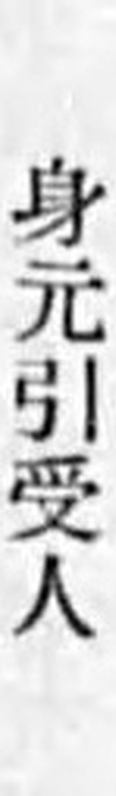身元引受人
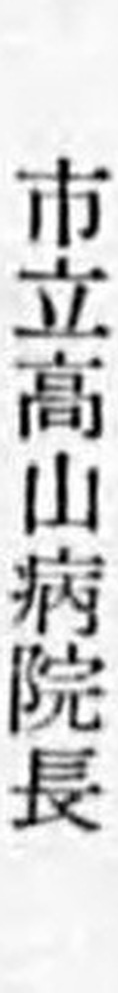市立高山病院長殿
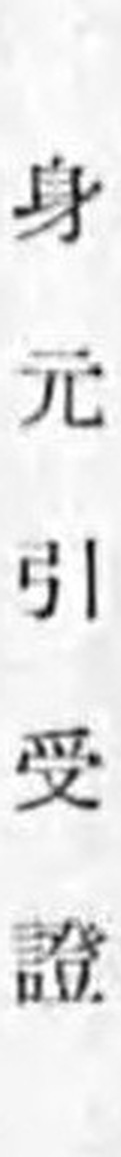身元引受証
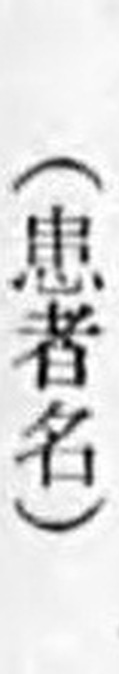(患者名)
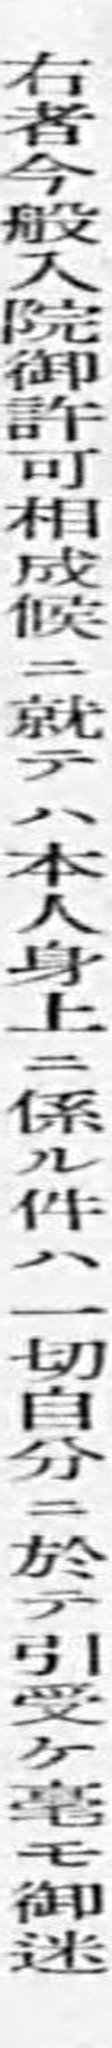右者今般入院御許可相成候ニ就テハ本人身上ニ係ル件ハ一切自分ニ於テ引受ケ毫モ御迷
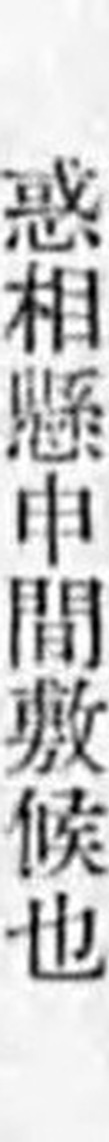惑相懸間敷候也
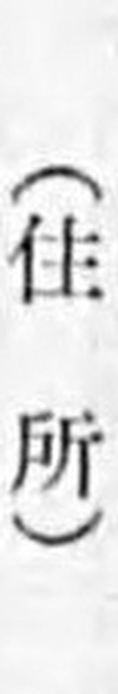(住所)
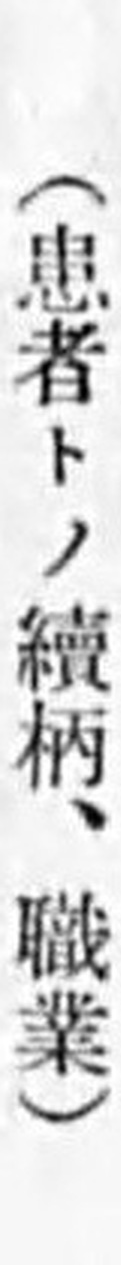(患者トノ続柄、職業)
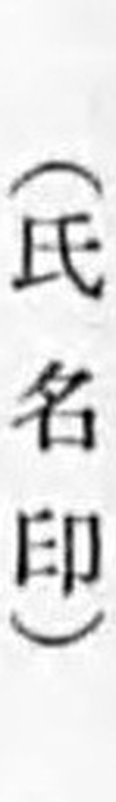(氏名印)
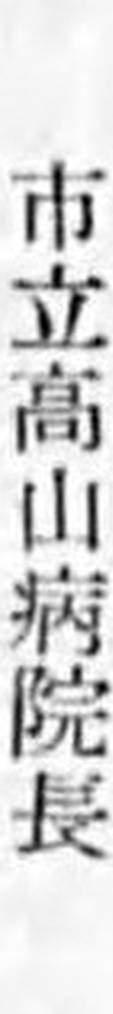市立高山病院長殿
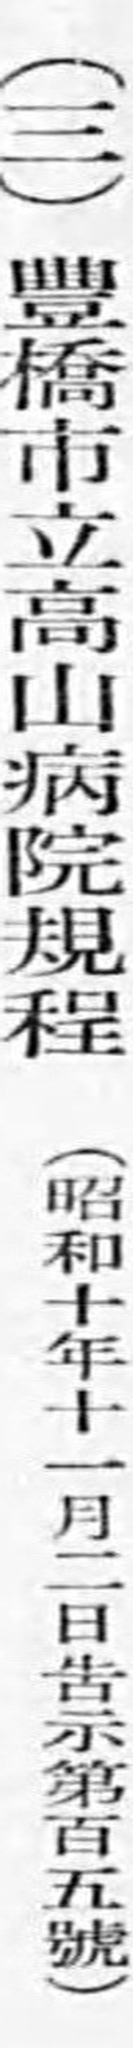(三)豊橋市立高山病院規程(昭和十年十一月二日告示第百五号)
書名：豊橋市立高山病院年報. 昭和12年度
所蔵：国立国会図書館 National Diet Library, JAPAN
